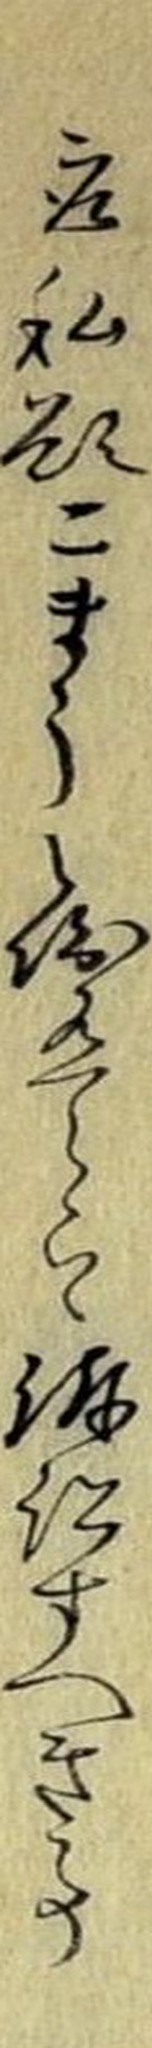取私願こまらし儀有之候ハヽ訴訟すへき事
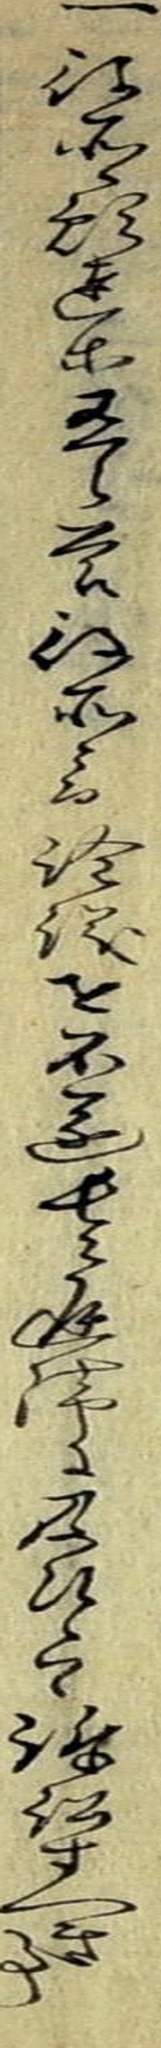一役所へ願達等有之節役所ニ而詮議を不遂長々遅滞に及ひ候ハヽ訴訟すへき事
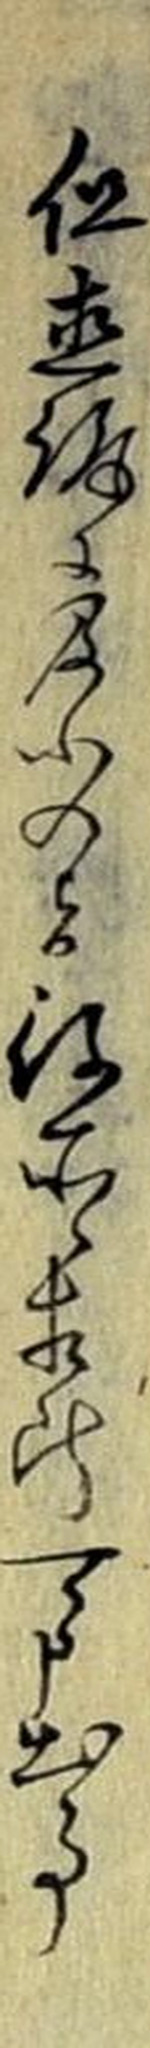但直訴に及ふの旨役所へ相断可申出事
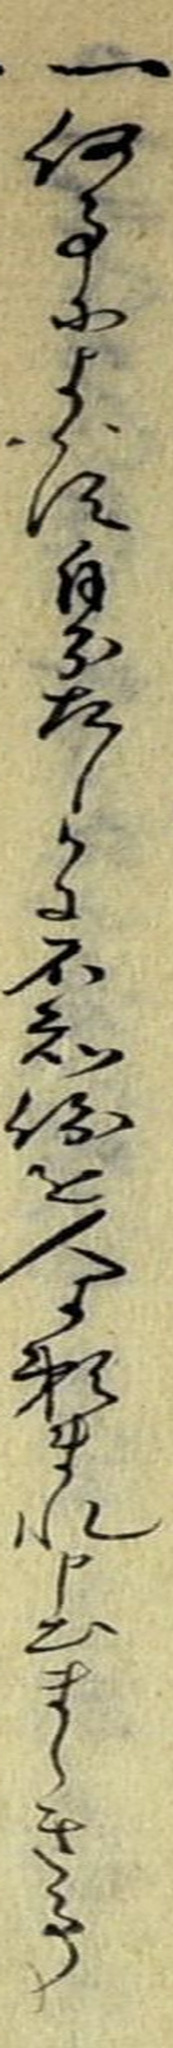一何事によらす自分たしかに不知儀を人に頼まれ申出ましき事
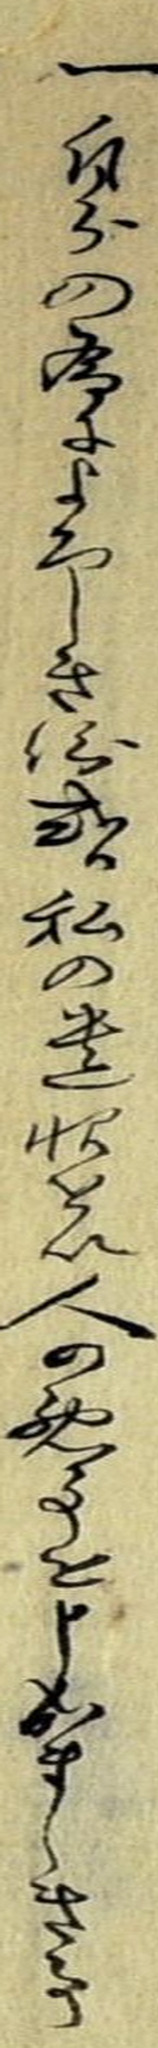一自分の為によろしき儀或ハ私の遣状を以人の悪事を申成ましき事
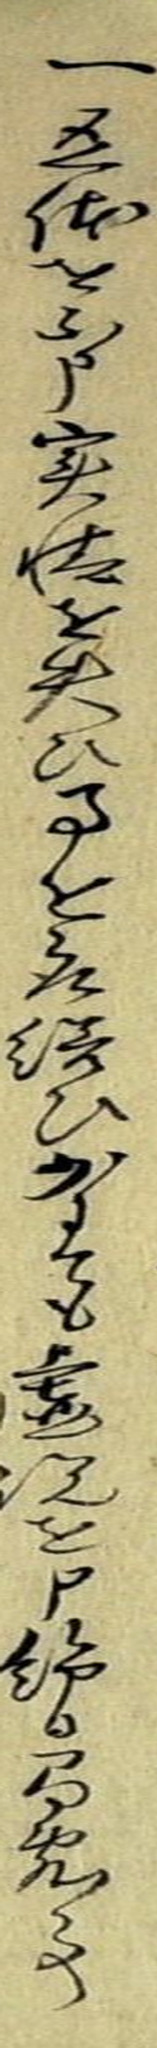一有体を不申実情を失ひ事を取繕ひ少にても虚説を申飾る間敷事
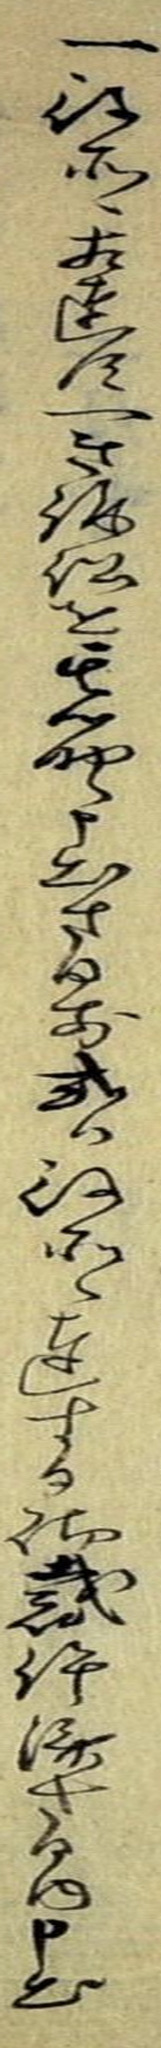一役所へ相達すへき訴訟を其筋へ申出さる前或ハ役所へ達する砌裁許済さる内申出
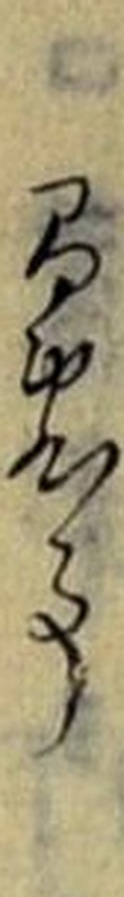間敷事
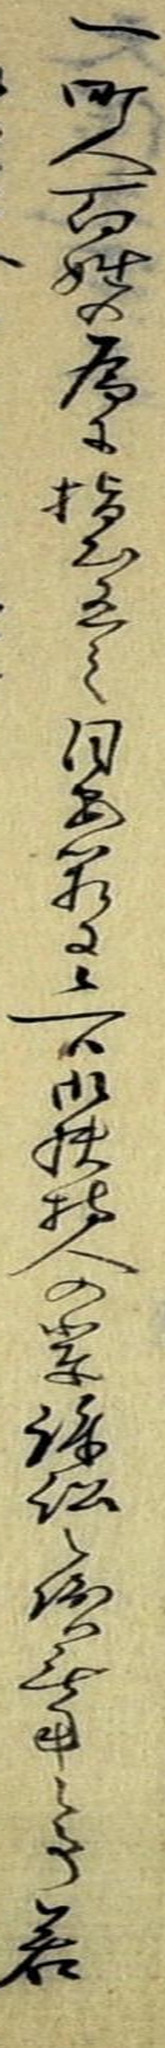一町人百姓の為に指出有之目安箱に候へハ御扶持人の輩訴訟之儀ハ無用之事若
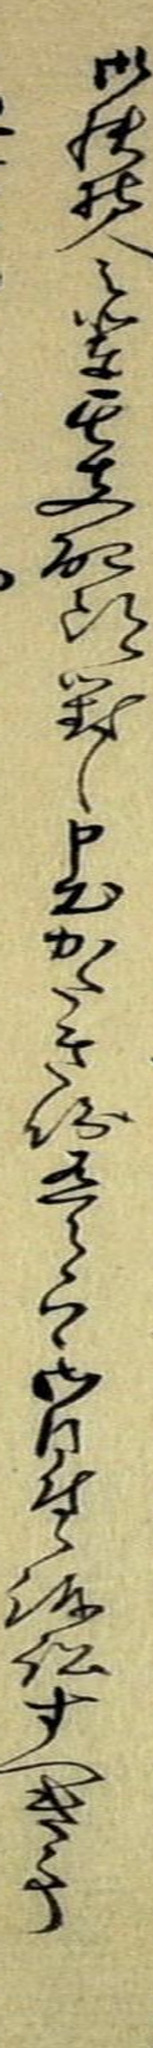御扶持人之輩其支配頭へ対し申出かたき儀有之候ハヽ御目付へ訴訟すへき事
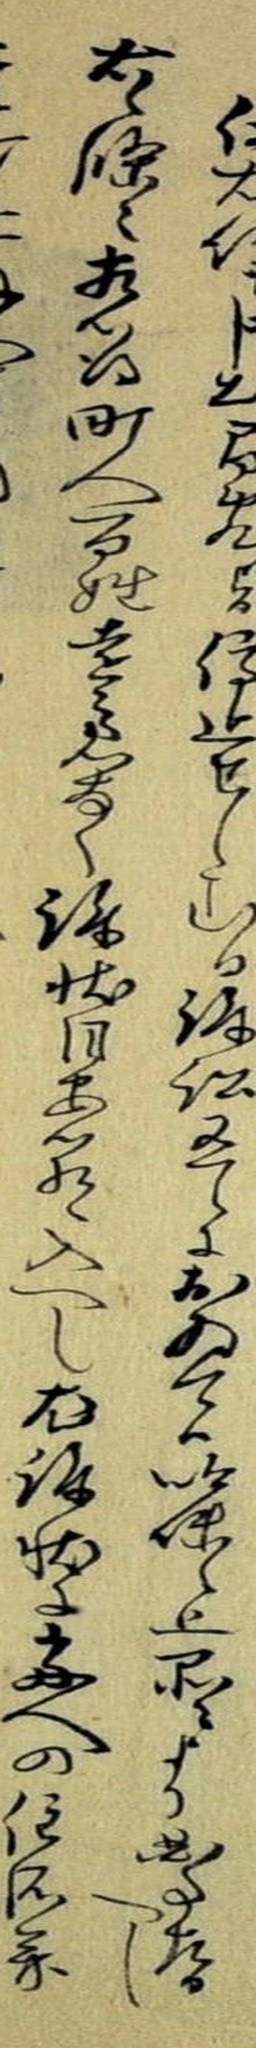右之条々相心得町人百姓遠慮なく添状目安箱へ入へし尤訴状に当人の住所并
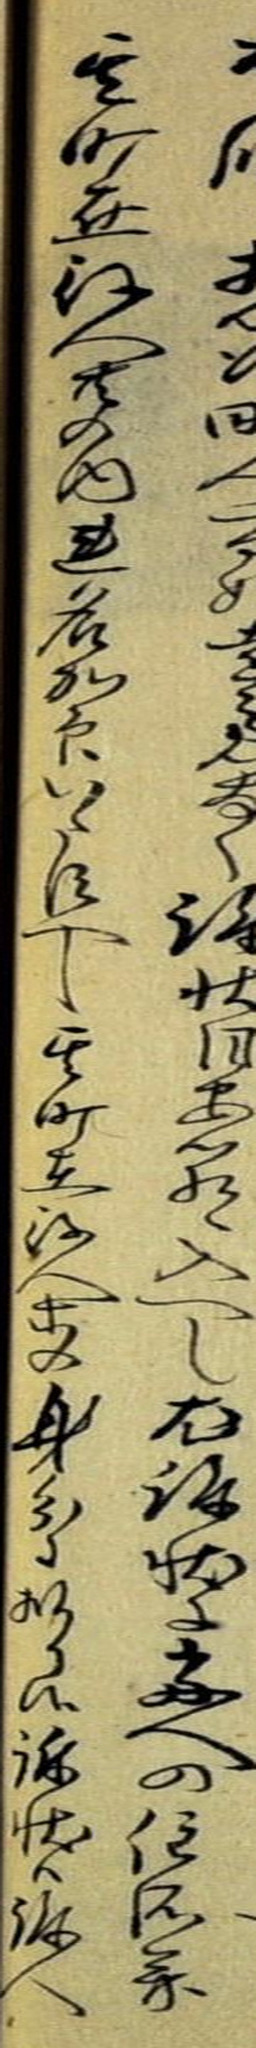其町在役人共の内連名加印いたすへし其町在の身分に掛り候訴状ハ訴人
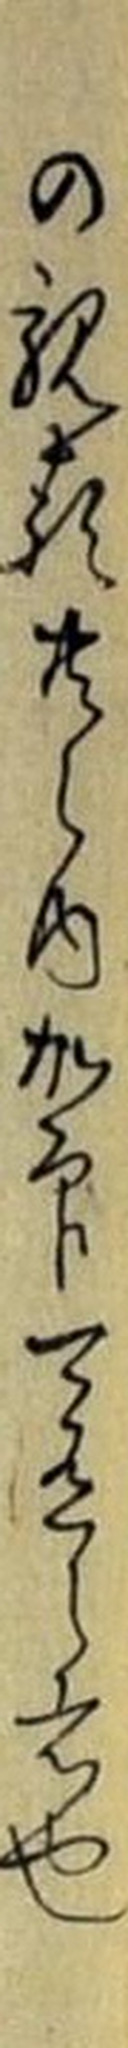の親類共之内加印可有之者也
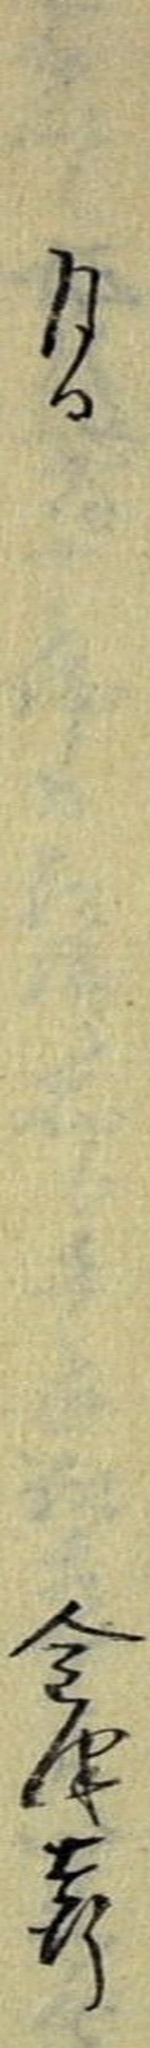月日金津奉行
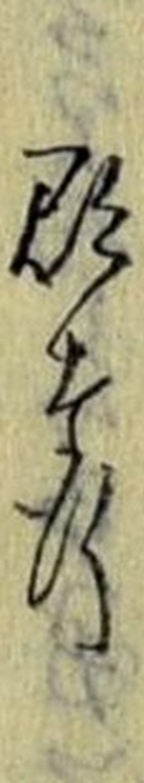郡奉行
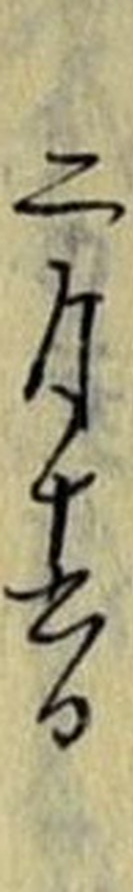二月十六日
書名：命令之部 五
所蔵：福井県文書館 Fukui Prefectural Archives
